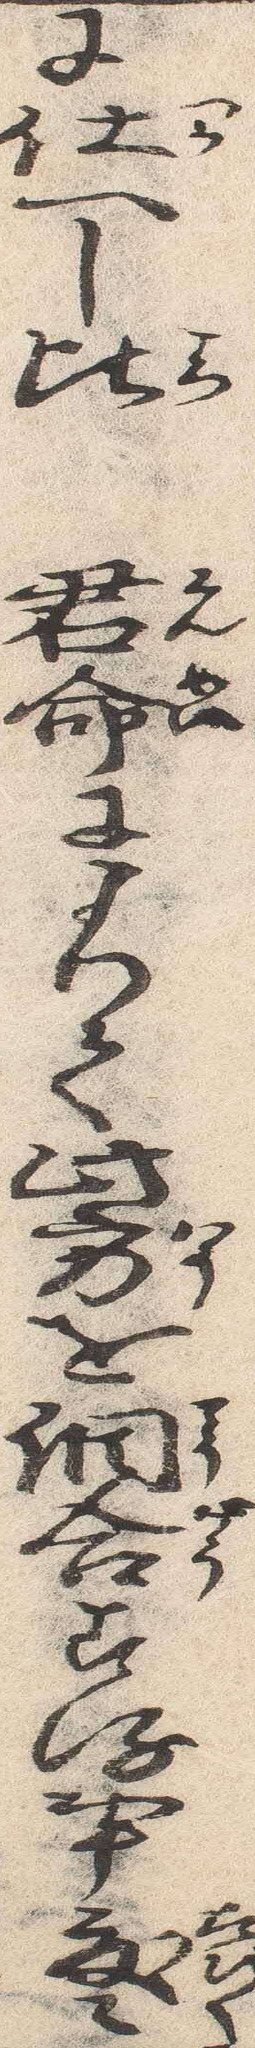に仕へし比君命によりて此方を調合する事度々
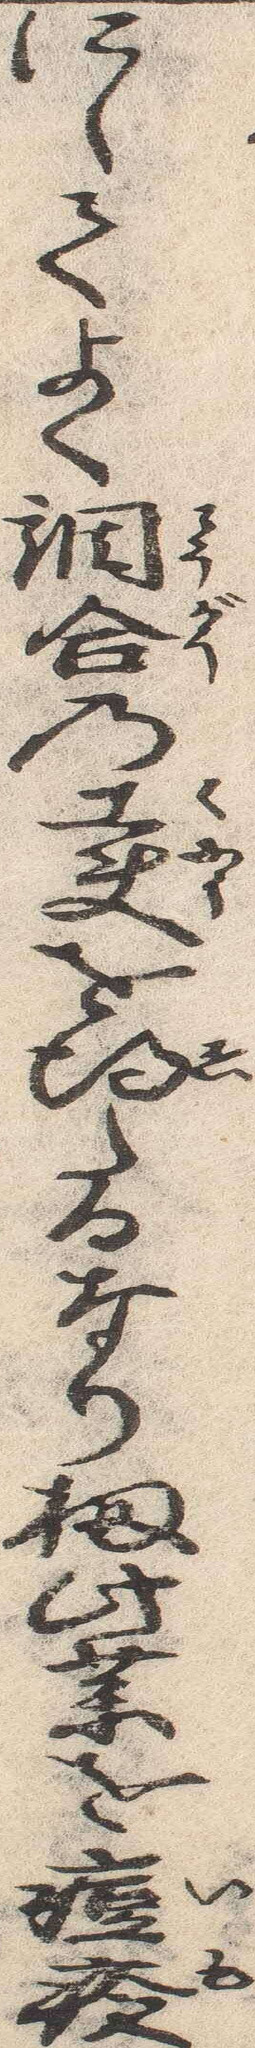にしてよく調合の工夫を得たるなり扨此薬を痘瘡
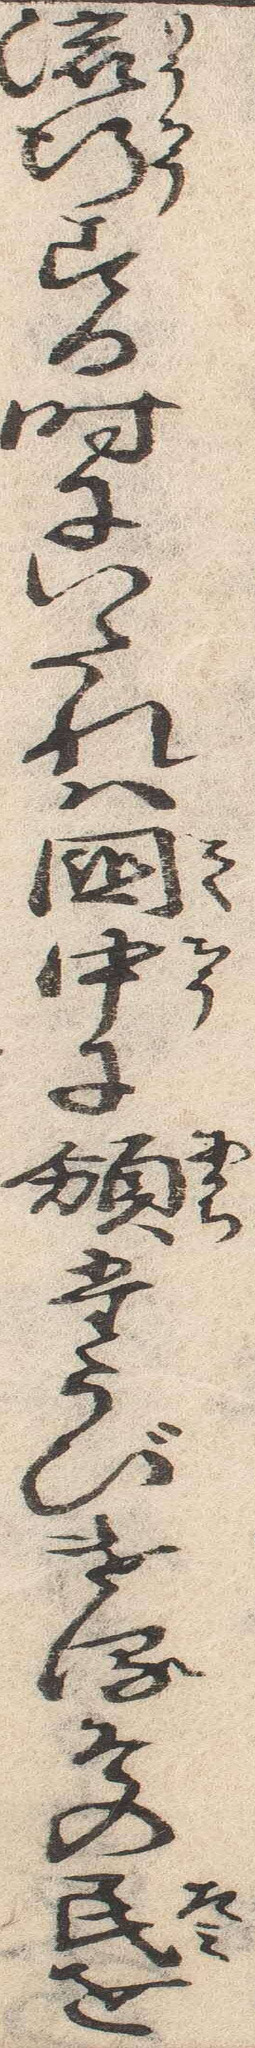流行する時にいたれは国中に頒たうびけるその民を
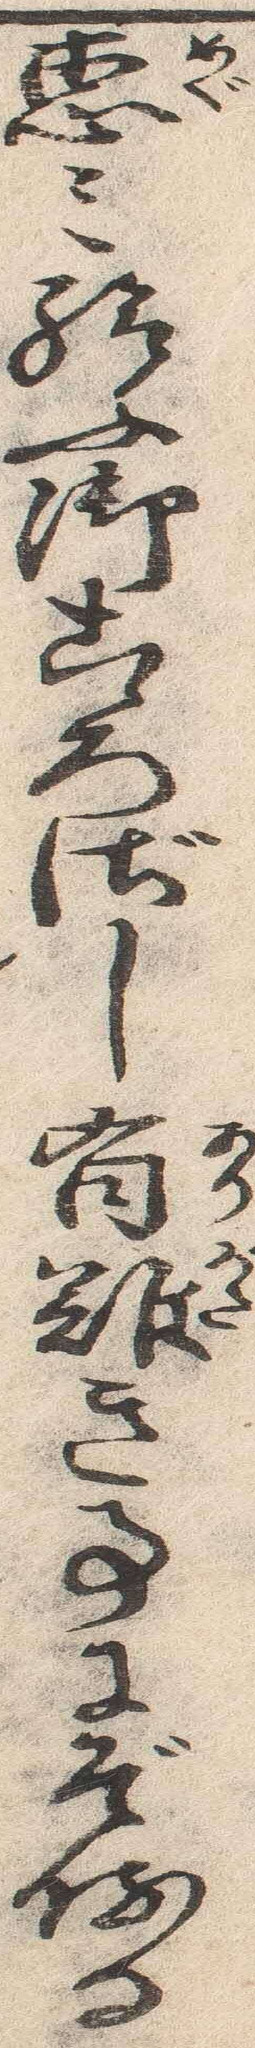恵み給ふ御こゝろざし有難き事にぞ侍る
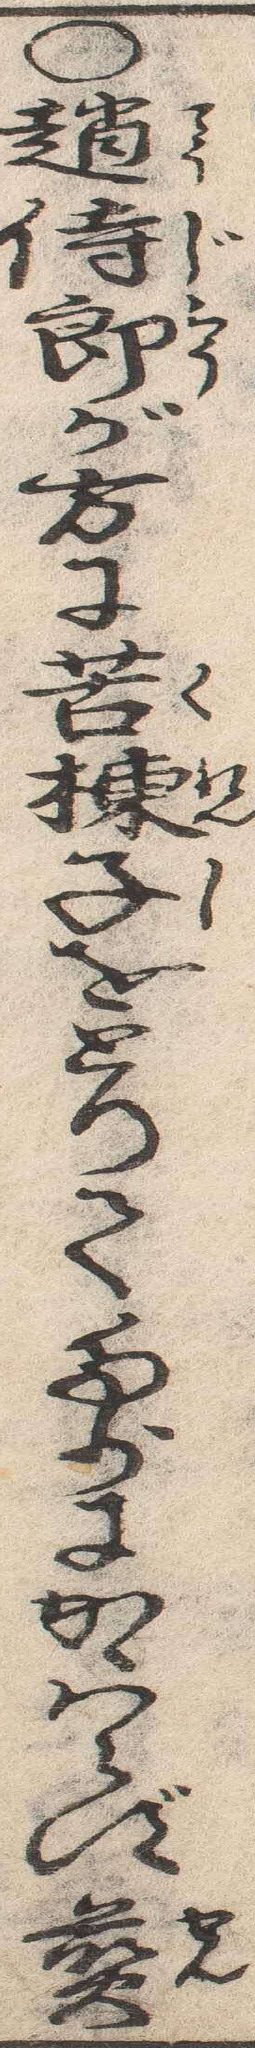○趙侍郎が方に苦楝子をとりて多少にかゝはらず煎
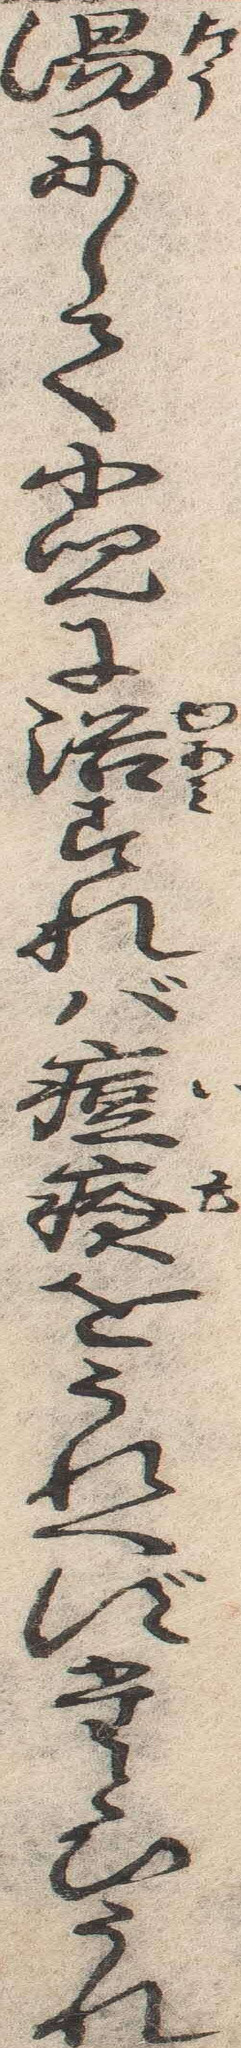湯にして小児に浴すれば痘瘡をうれへずたとひうれ
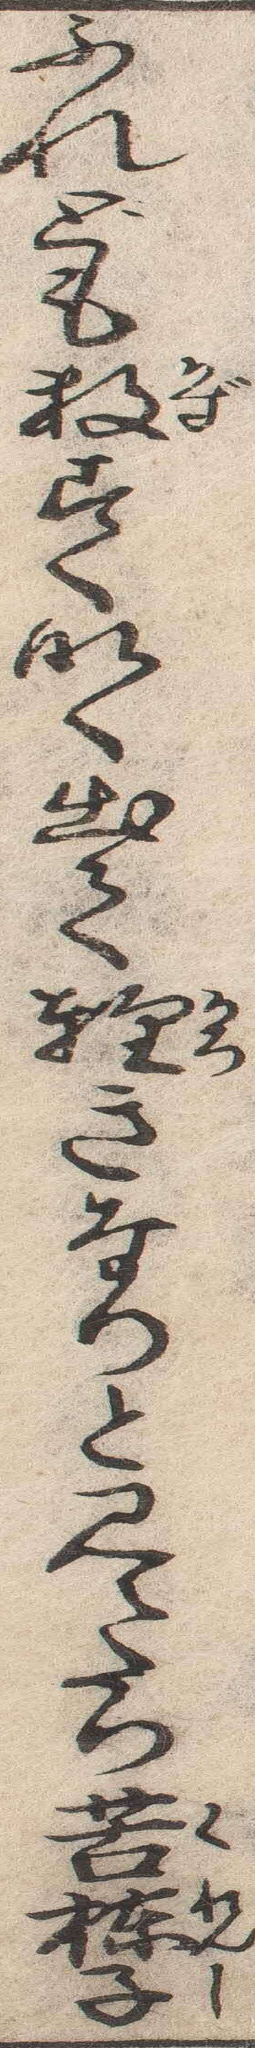ふれども数すくなく出て軽きなりと見えたり苦楝子
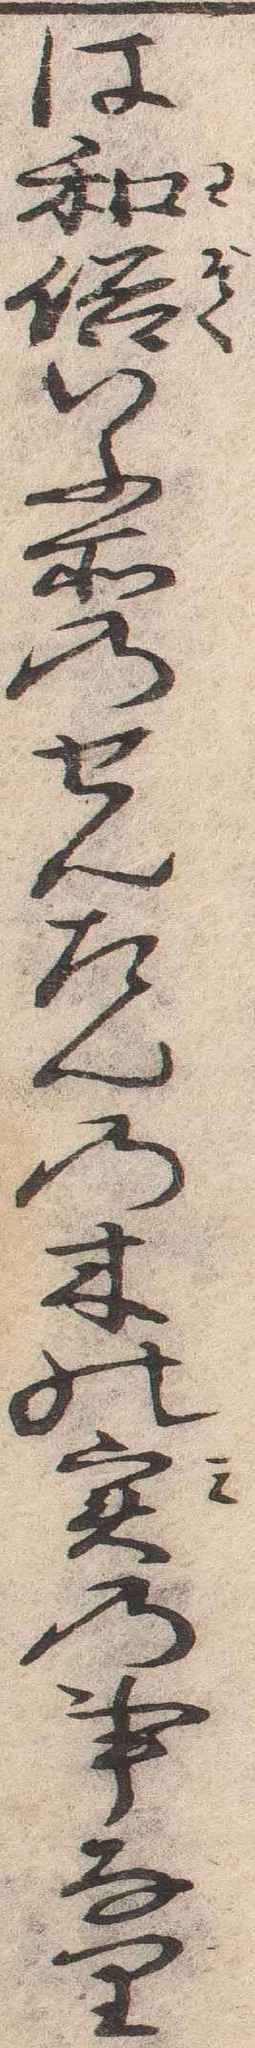は和俗いふ所のせんたんの木の実の事なり

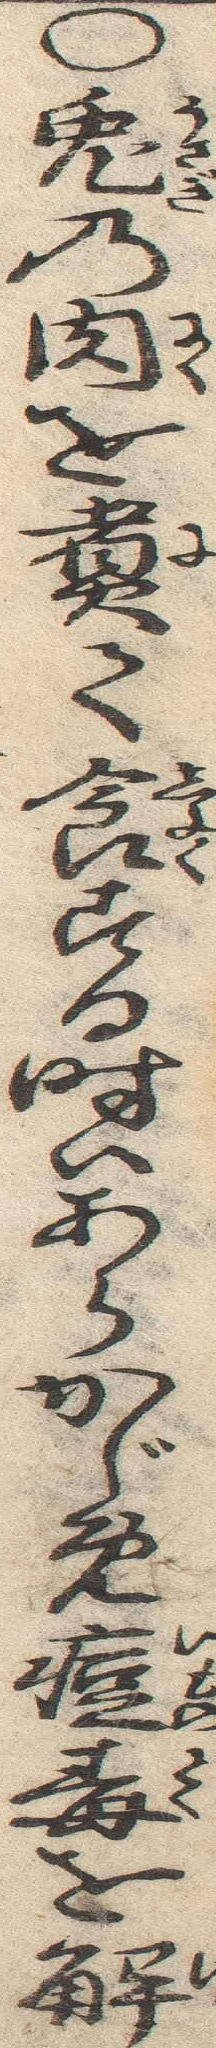○兔の肉を煮て食する時はあらかじめ痘毒を解
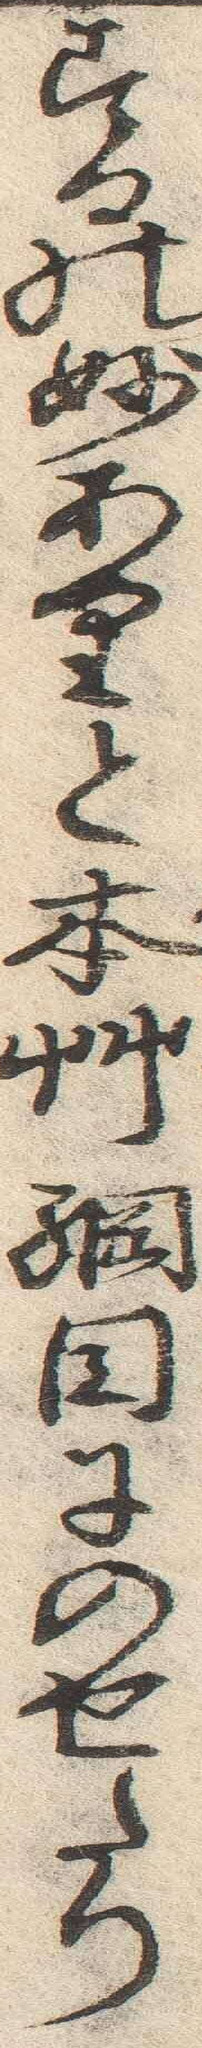するの妙ありと本草綱目にのせたり
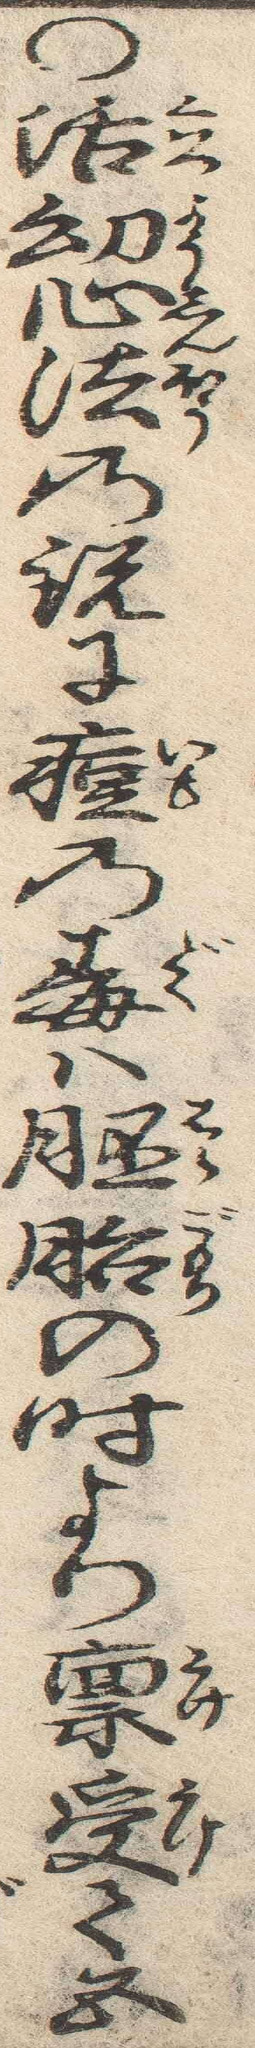○活幼心法の説に痘の毒は胚胎の時より稟受て五
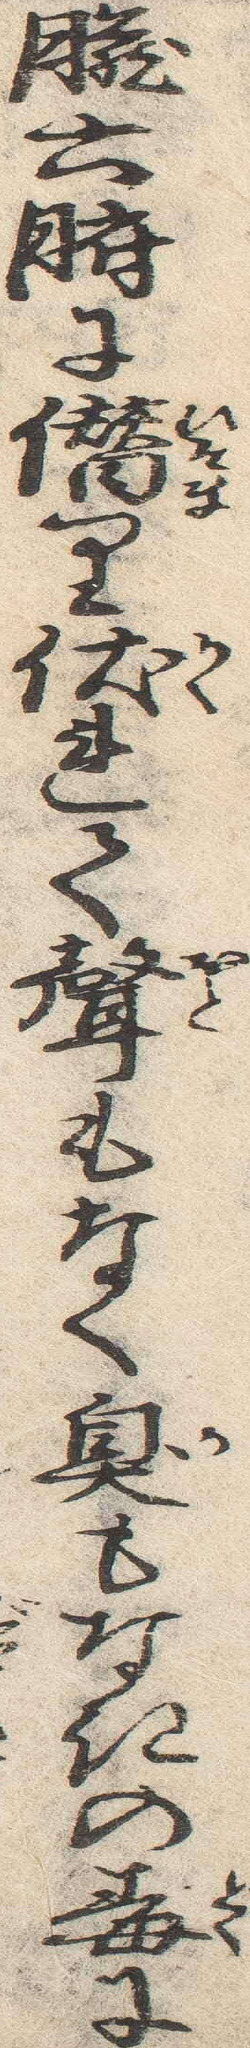臓六腑に潜り伏れて声もなく臭もなきの毒に
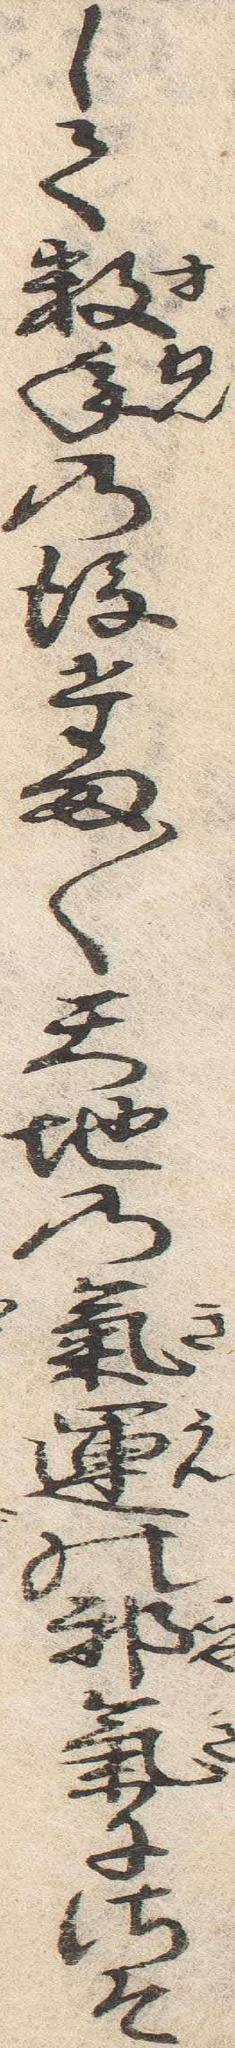して数年の後たま〳〵天地の気運の邪気にさそ
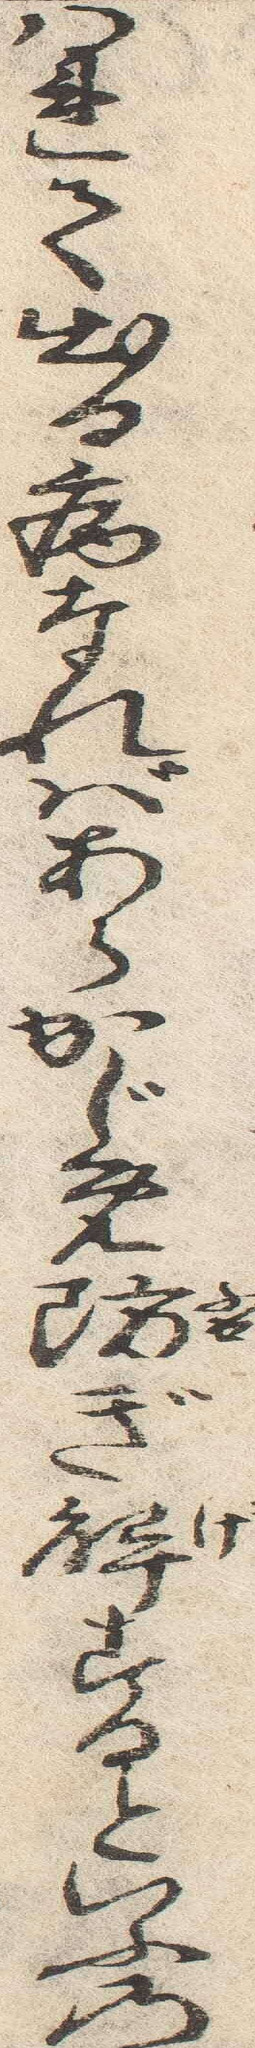はれて出る病なればあらかじめ防ぎ解するといふの
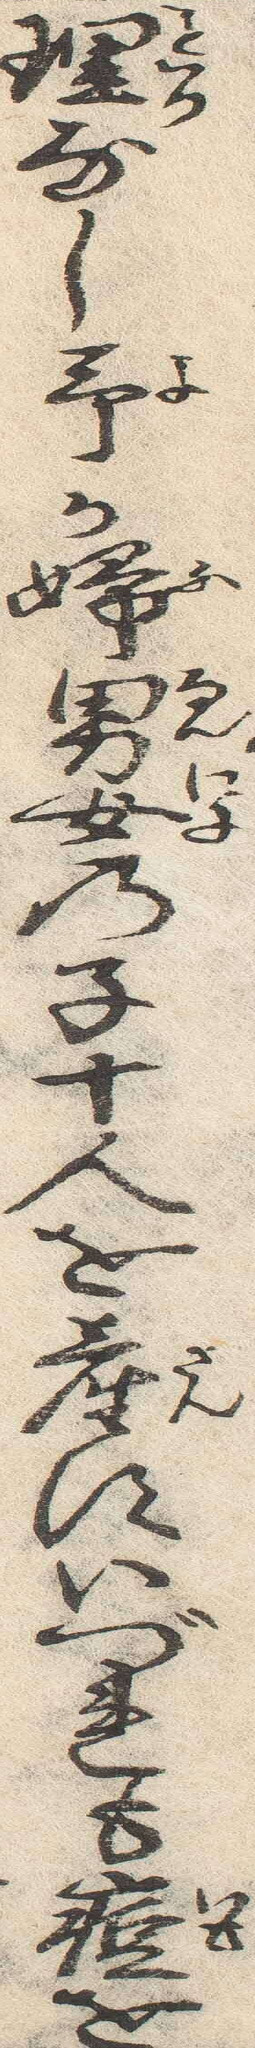理なし予か婦男女の子十人を産すいづれも痘を
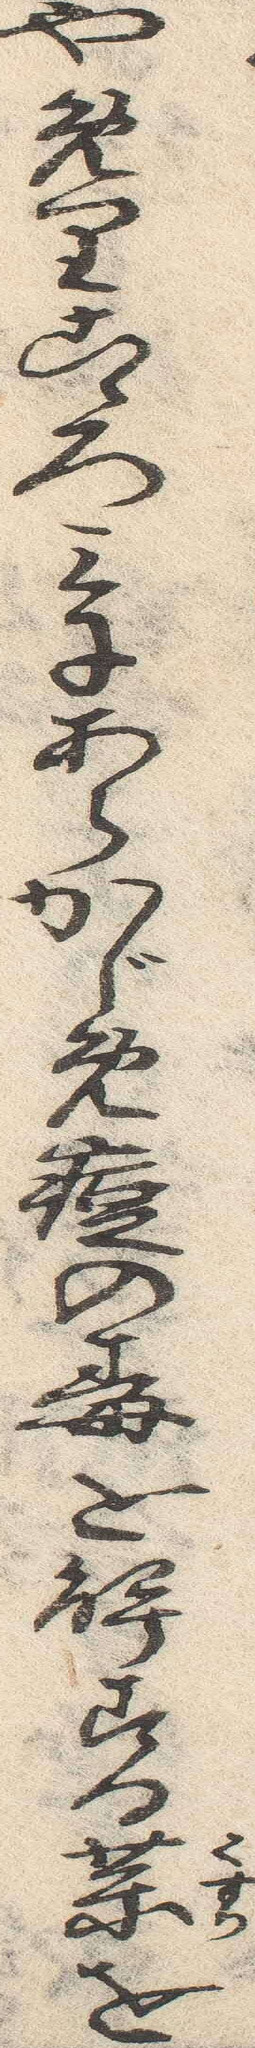やめりこゝろみにあらかじめ痘の毒を解する薬を
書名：小児必用養育草
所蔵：東京学芸大学附属図書館 国文学研究資料館
